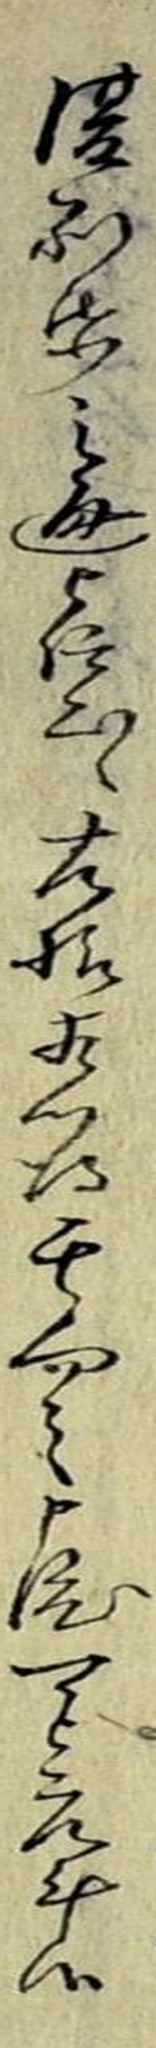復別紙之通被仰出候左様相心得其向々へ申渡可被取斗候
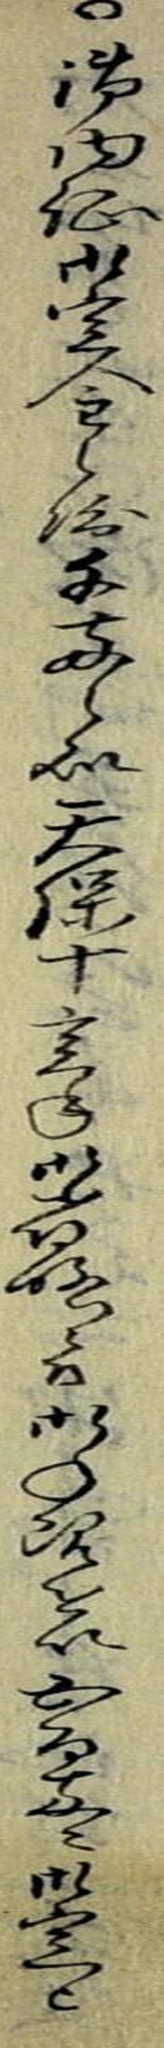○御内証御定金之儀千両之処天保十亥年御省略に付御年限を以五百両に相定被
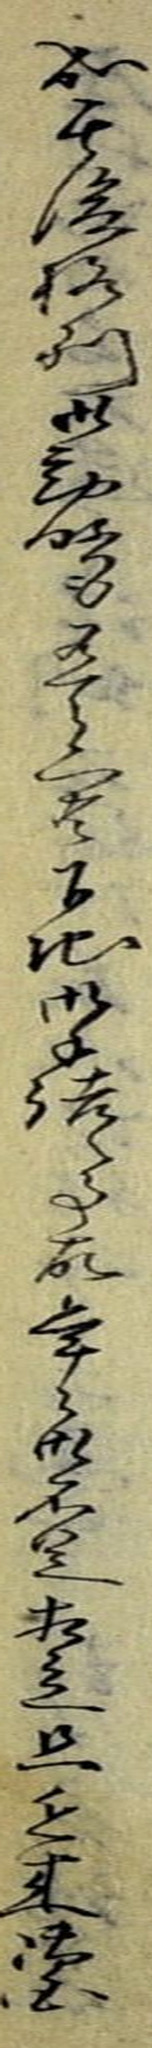成其後格別御勘略も有之候へ共下地御手詰事故年々御不足相立且近来御国
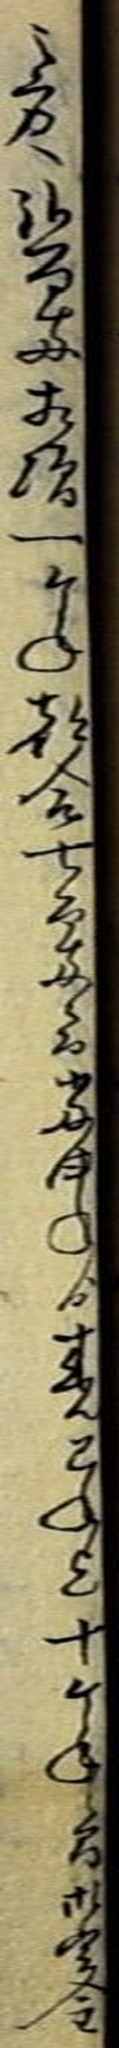之方へ弐百両相増一ケ年都合七百両に而当申年ゟ来ル巳年迄十ヶ年之間御定金
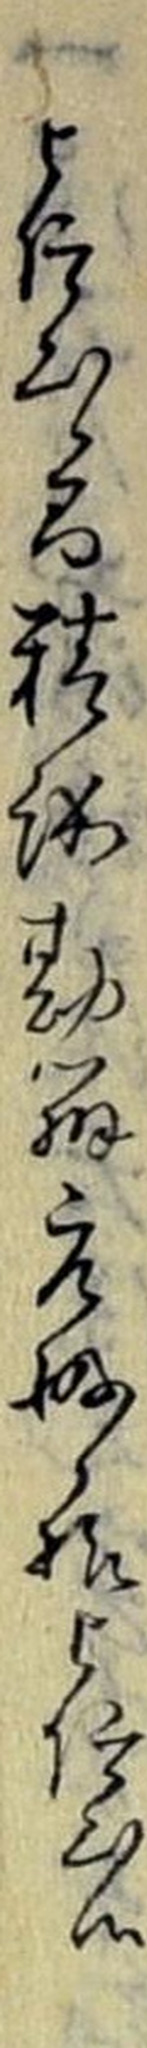被仰出候間精誠勘弁取扱候様被仰出候
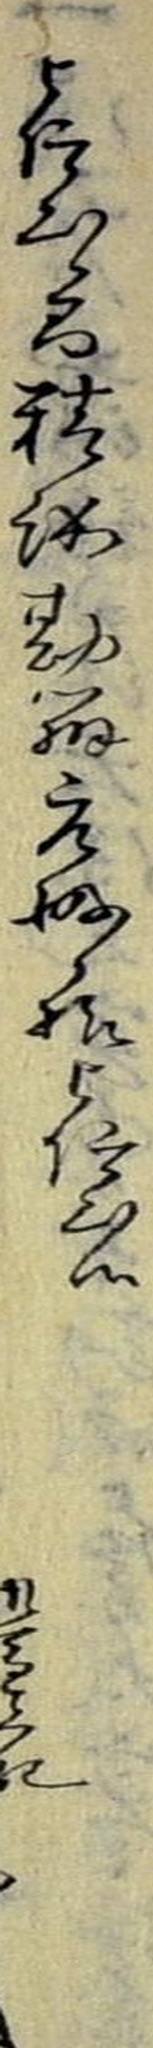被仰出候間精誠勘弁取扱候様被仰出候
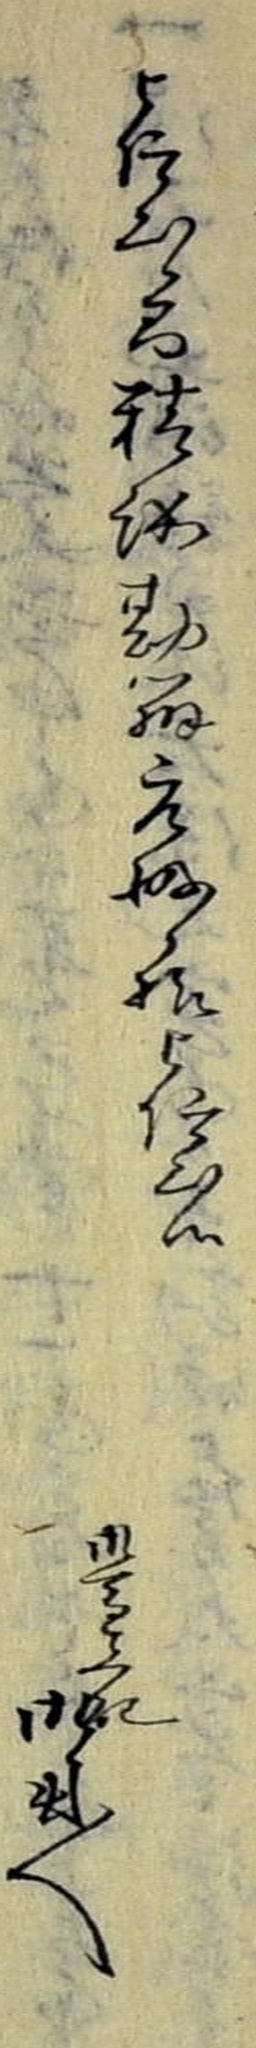被仰出候間精誠勘弁取扱候様被仰出候
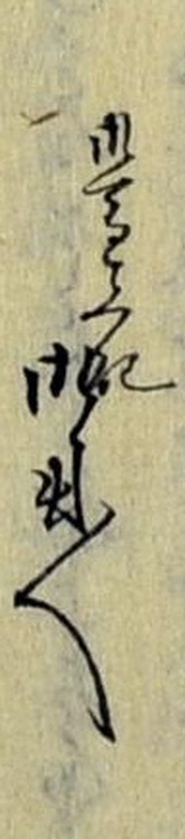御馬支配御用人
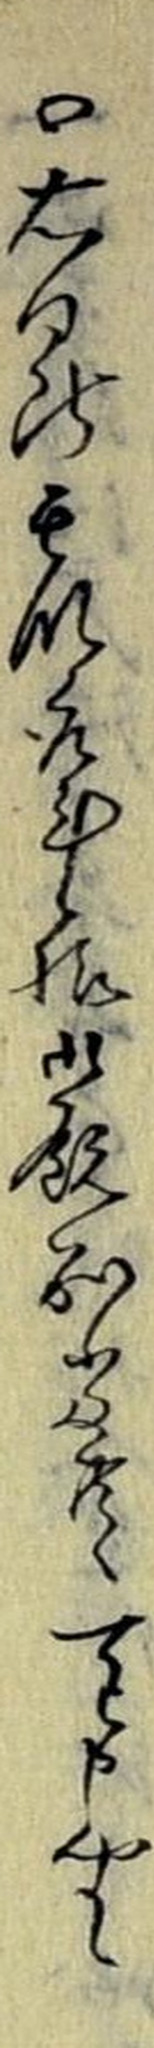○右同断其段取斗候様御厩別当共へ可被申聞候
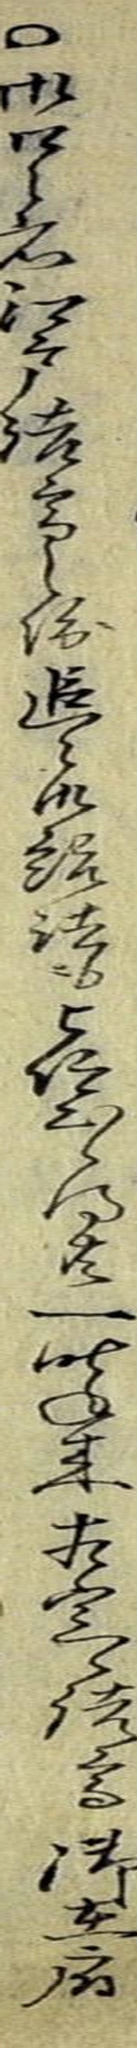○御口之者江戸詰高之儀追々御趣法も被仰出候得共一昨年來相定候詰高御在府
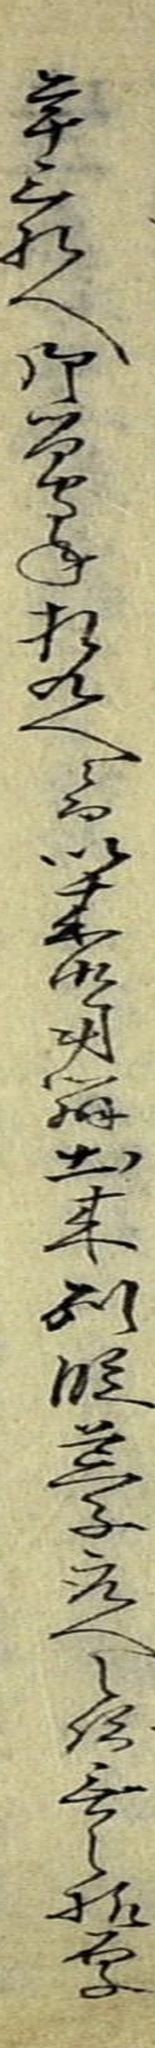年三拾人御留守年拾九人に而以來御用弁出来別段荒子取人之儀無之様厚
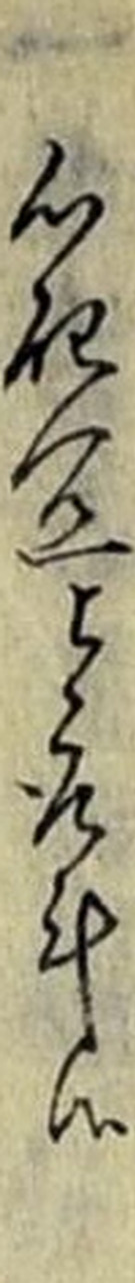心配宜被取斗候
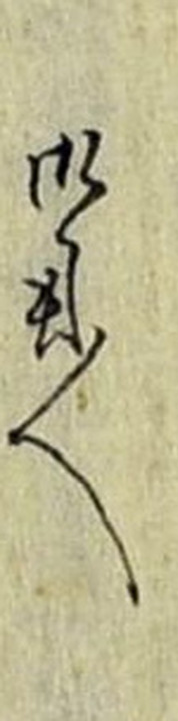御用人
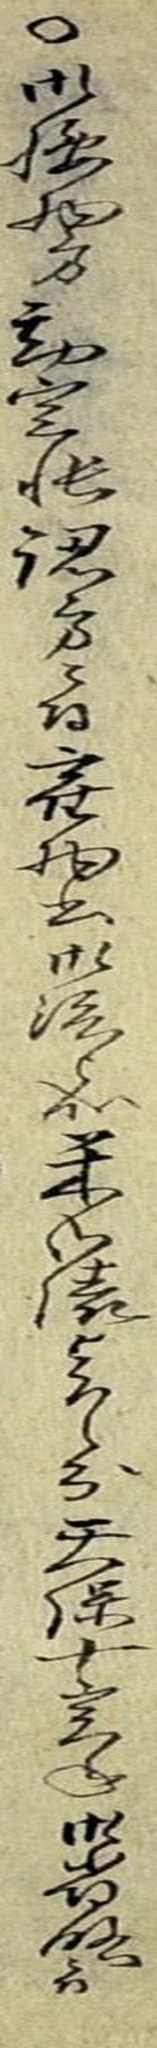○御腰物方勘定帳認方に付雇物書御渡被成米弐俵被下候分天保十亥年御省略に付
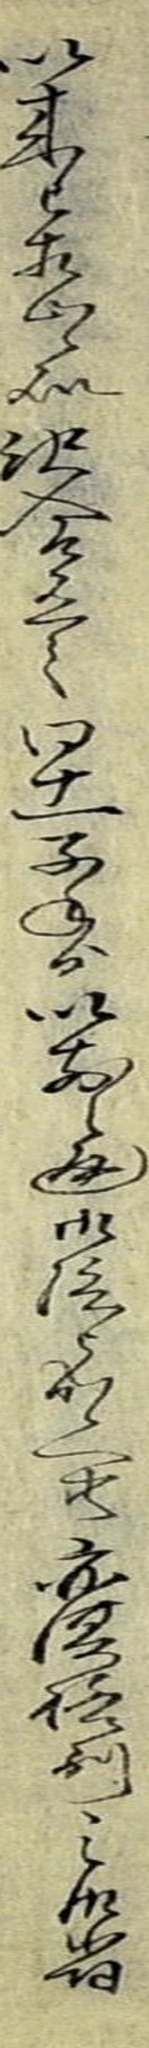以來被相止候処訳合有之同十一子年ゟ以前之通御渡被成候へ共亦復格別之御省
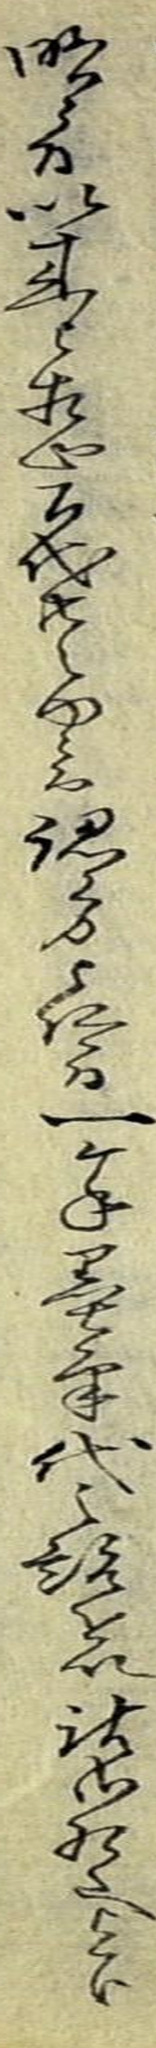略に付以來被相止下代共之内に而認方被仰付一ケ年墨筆代之趣を以銀弐拾匁被下
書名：命令之部 六
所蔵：福井県文書館 Fukui Prefectural Archives
